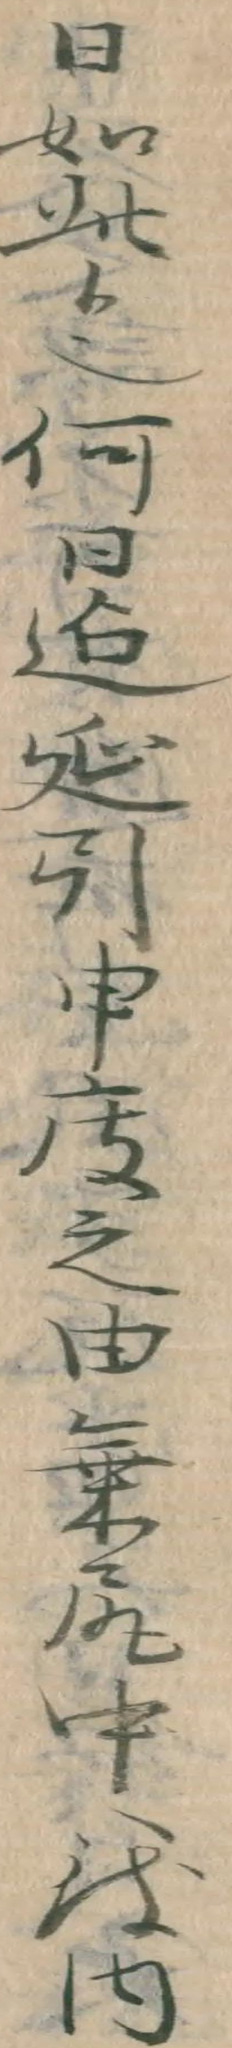日如此候也何日迄延引申度之由乗尻中へ致内
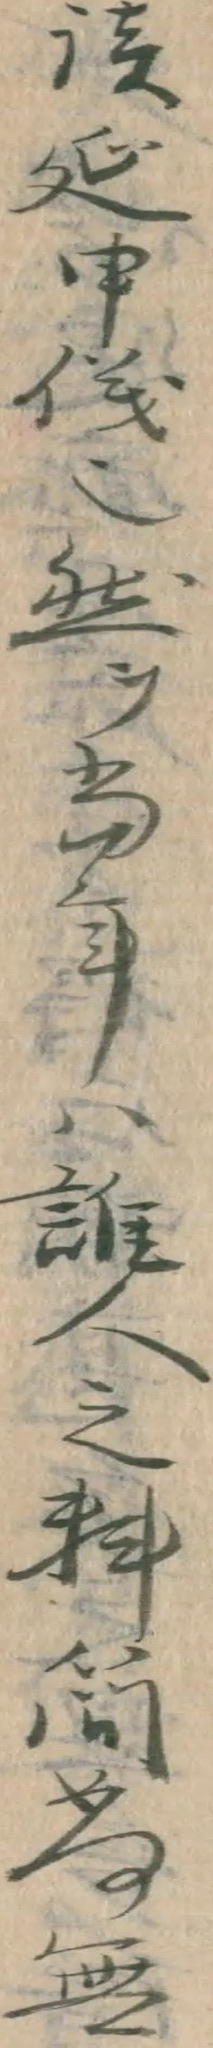談延申儀也然ヲ当年ハ誰人之料簡如何無
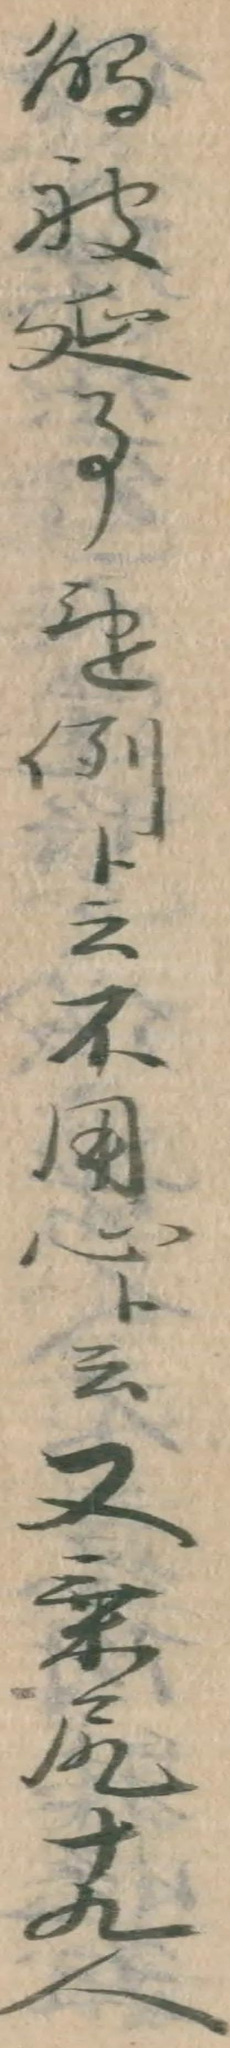触被延事遣例ト云不用心ト云又乗尻十九人
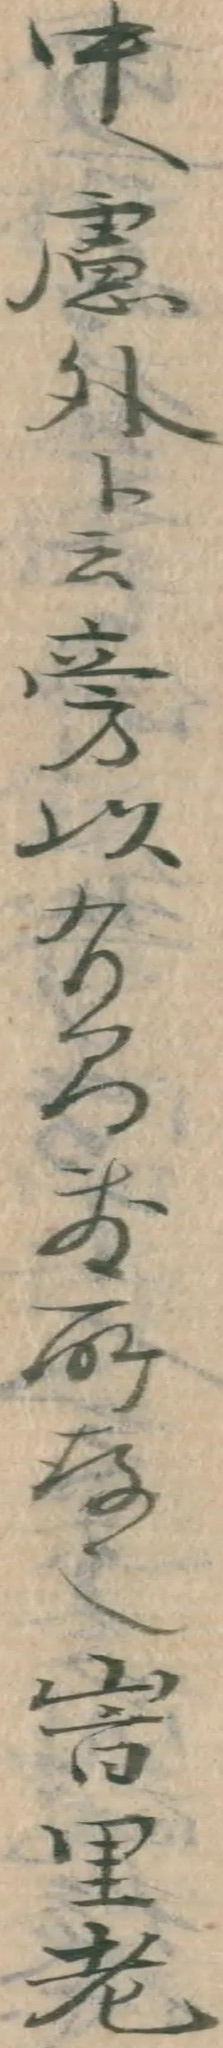中へ慮外ト云旁以有間敷所存也旹里老
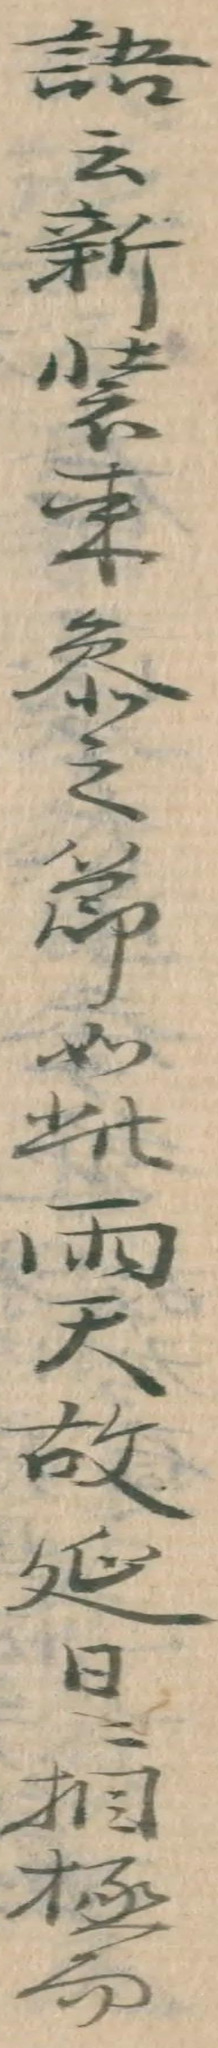語云新装束参之節如此雨天故延日ニ相極而
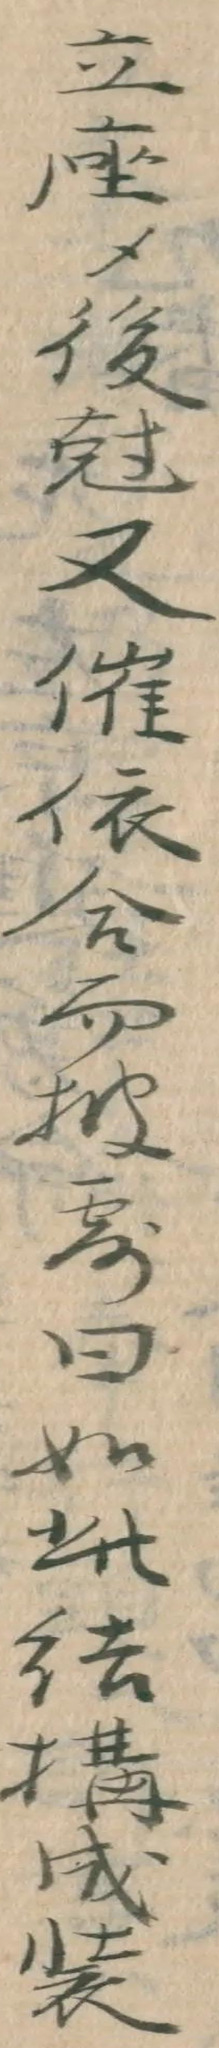立座シテ後尅又催依合而披露曰如此結構成装
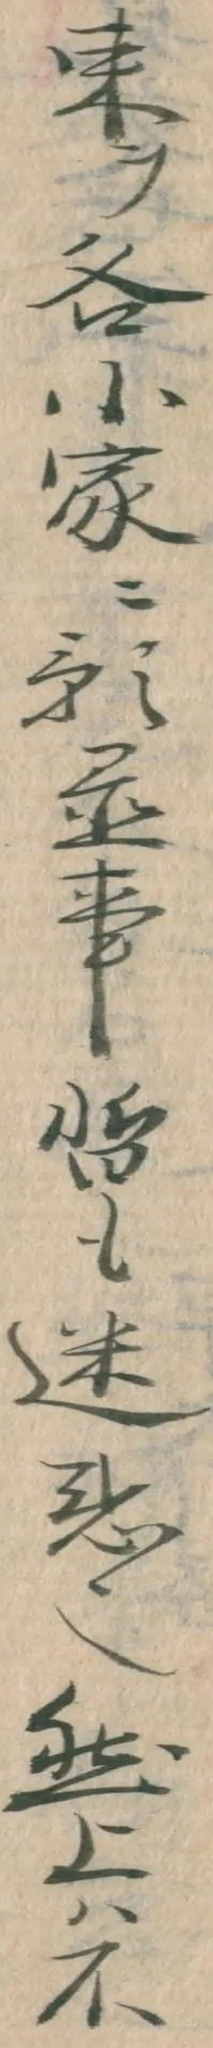束ヲ各小家ニ預置事暫も迷惑也然上ハ不
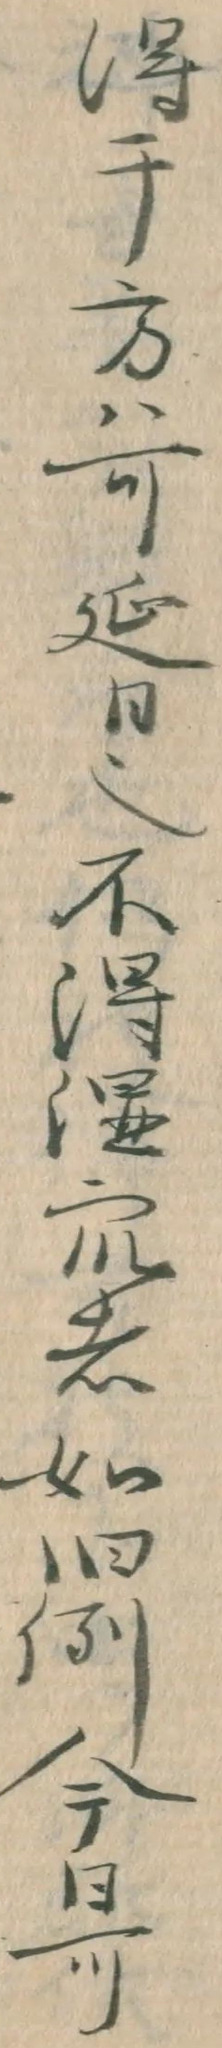得于方ハ可延日也不得湿衆者如旧例今日可
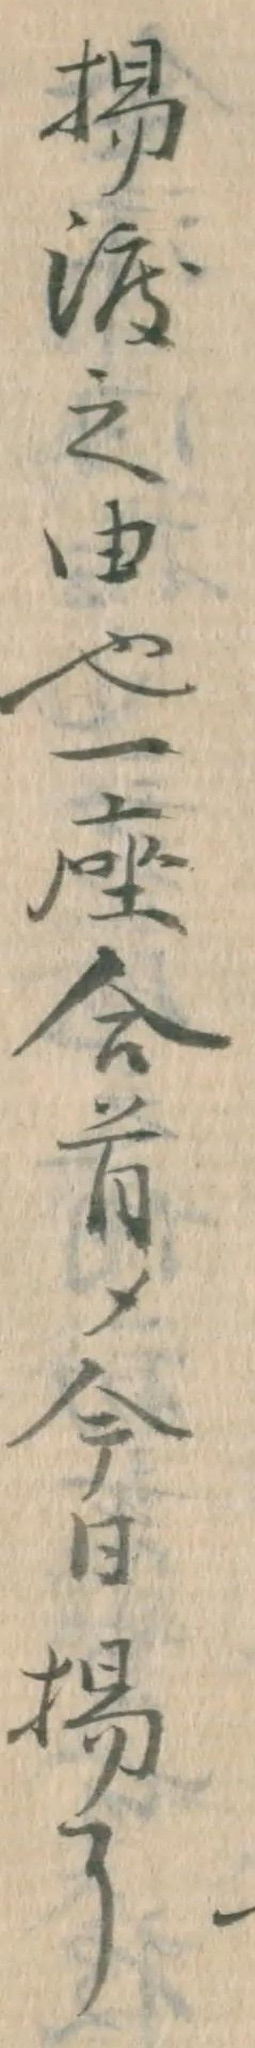揚渡之由也一座合首シテ今日揚了
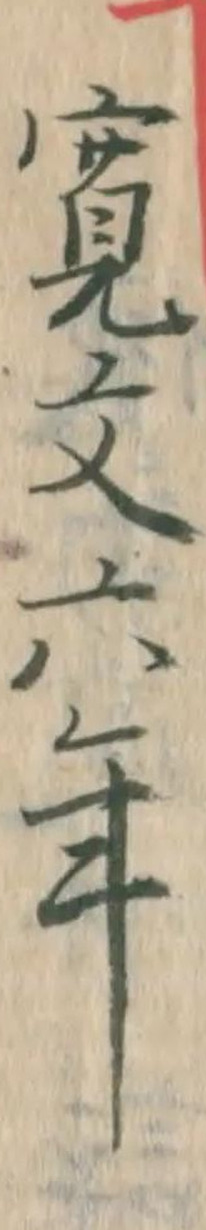寛文六年
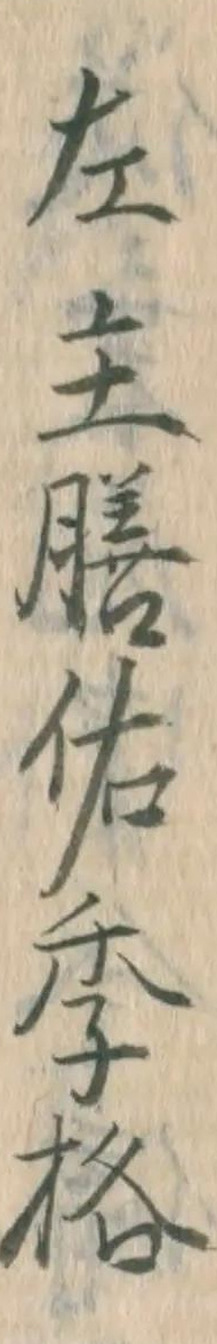左主膳佑季格
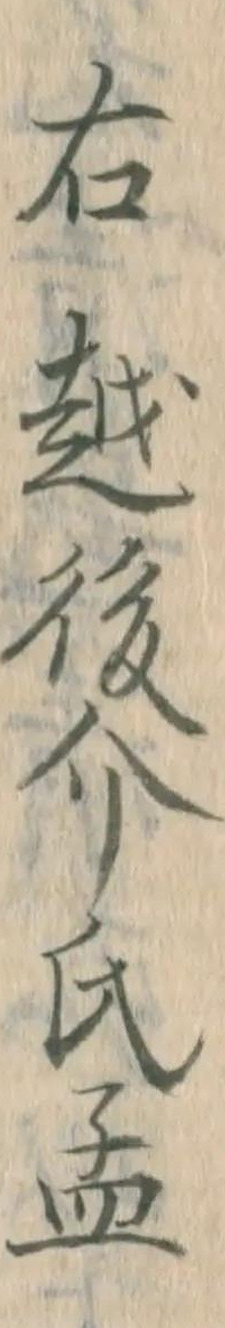右越後介氏孟
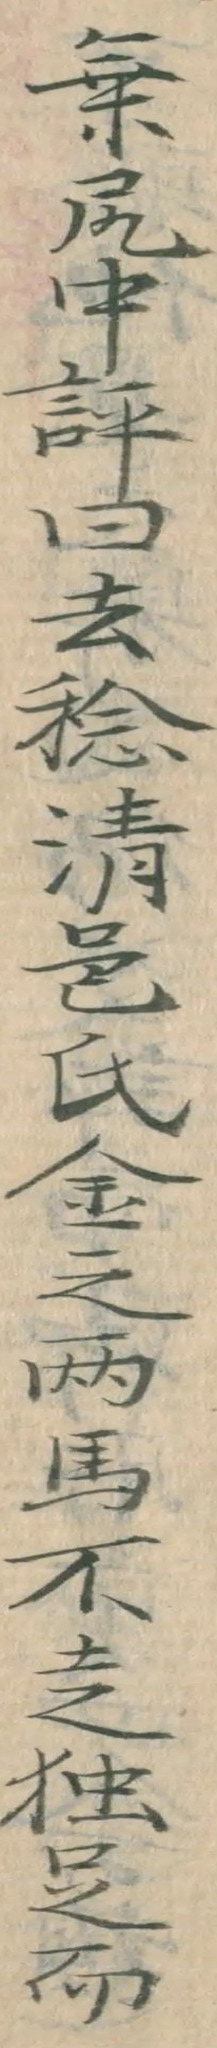乗尻中評曰去稔清邑氏金之両馬不走独足而
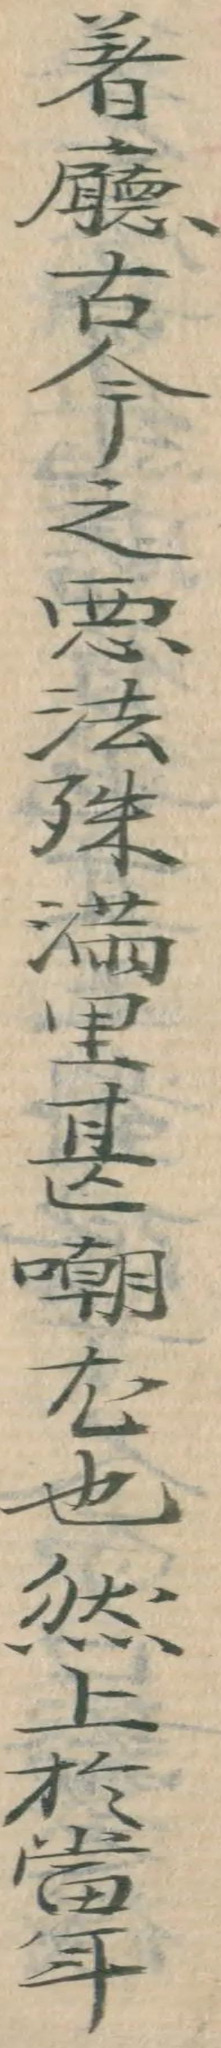着庁古今之悪法殊滿里甚嘲尤也然上於当年

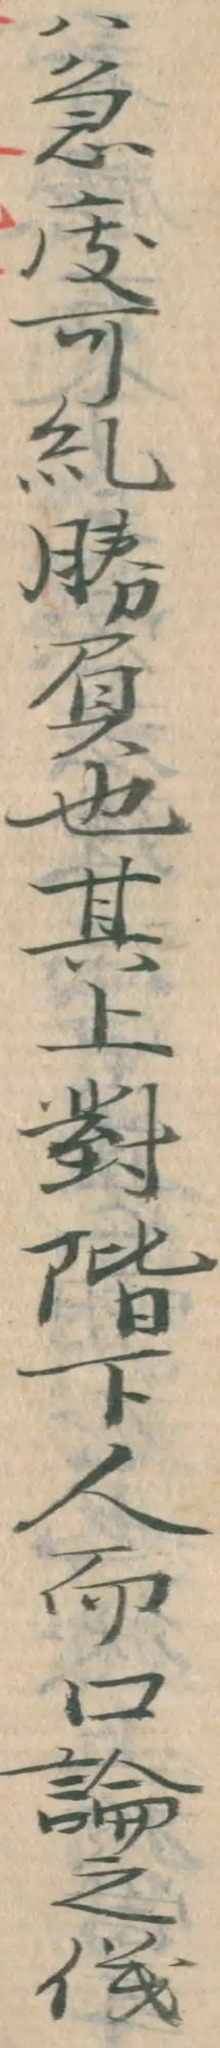ハ急度可糺勝負也其上対階下人而口論之儀
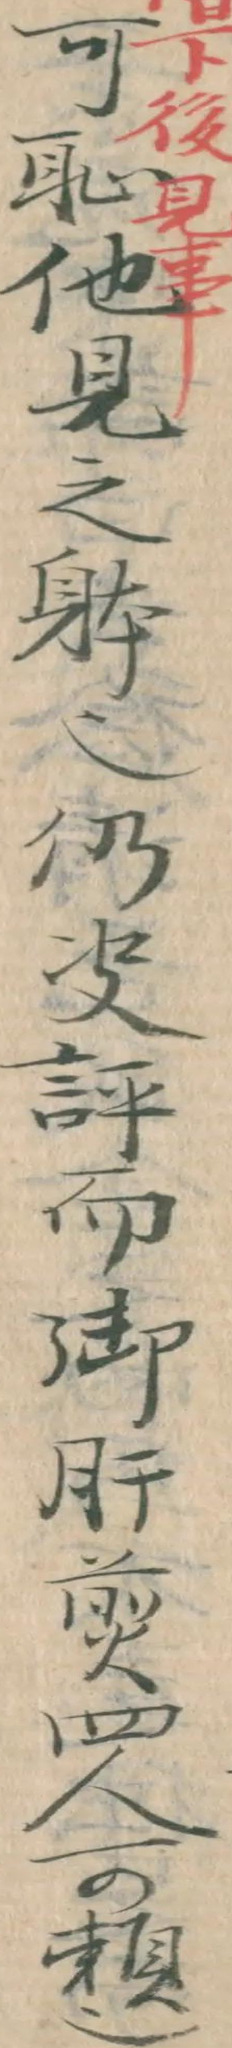可恥他見之体也仍決評而御肝煎四人可頼也
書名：賀茂社記録. 第10冊
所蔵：国立国会図書館 National Diet Library, JAPAN
